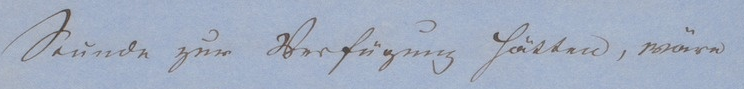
Stunde zur Verfügung hätten, wäre
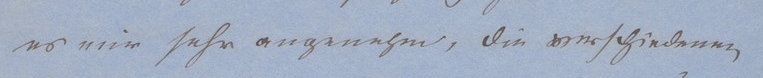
es mir sehr angenehm, die verschiedenen
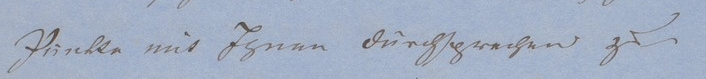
Punkte mit Ihnen durchsprechen zu
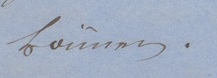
können.
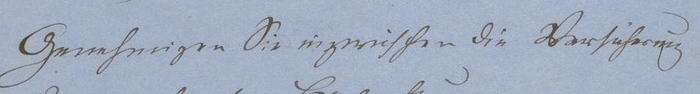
Genehmigen Sie inzwischen die Versicherung
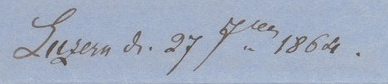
Luzern d. 27 7ber 1864.
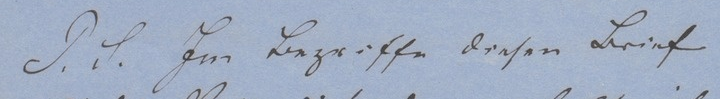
P. S. Im Begriffe diesen Brief
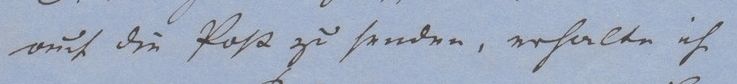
auf die Post zu senden, erhalte ich
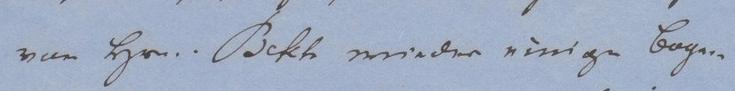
von Hrn. Bekh wieder einige Bogen
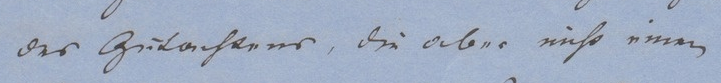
des Gutachtens, die aber nicht einen
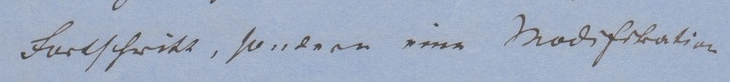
Fortschritt, sondern eine Modifikation
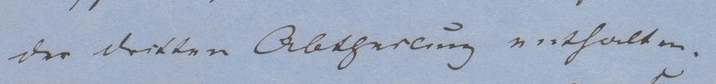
der dritten Abtheilung enthalten.
